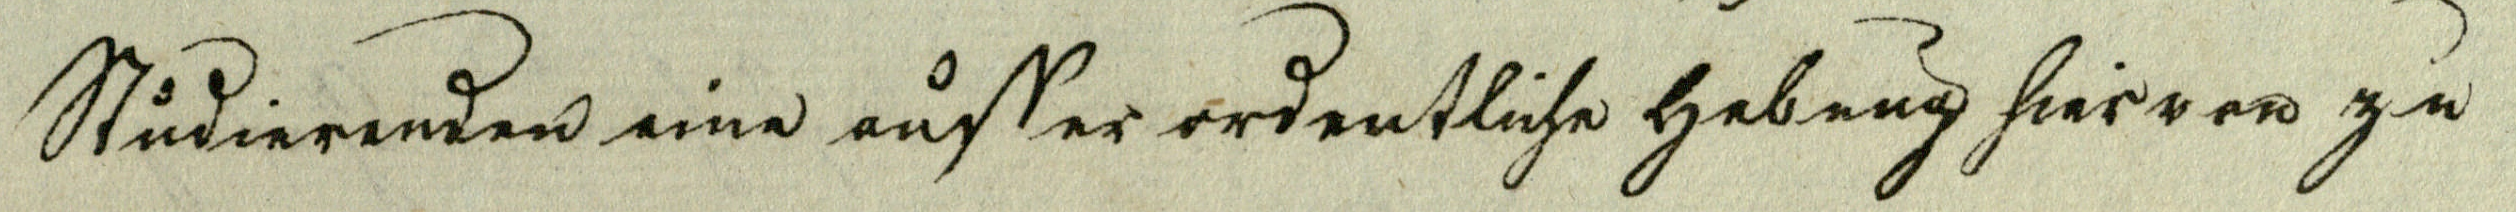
Studierenden eine ausser ordentliche Hebung hiervon zu
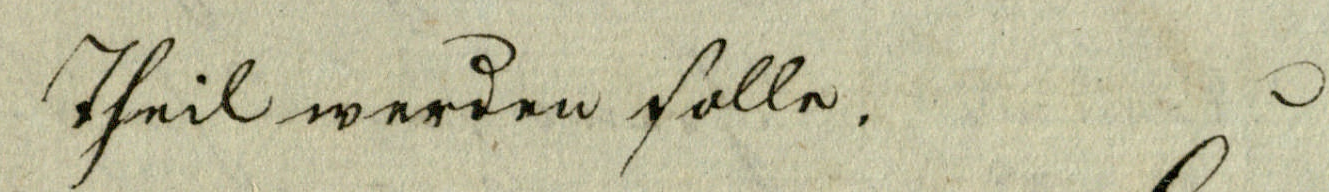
Theil werden solle.
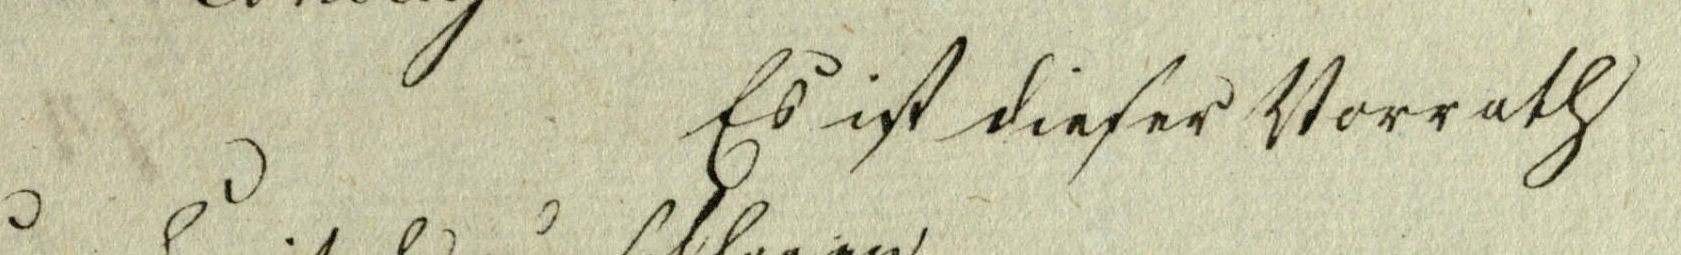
Es ist dieser Vorrath
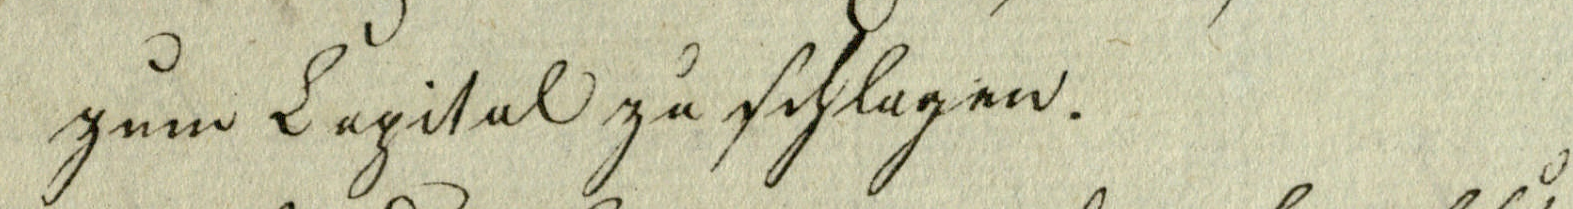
zum Capital zu schlagen.
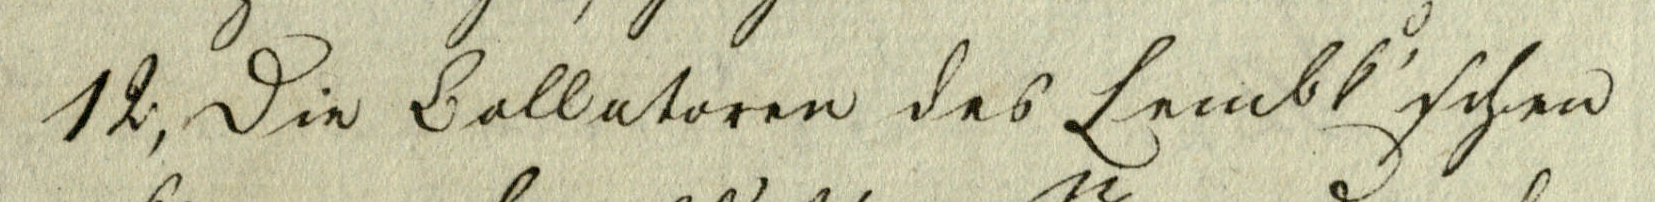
12, Die Collatoren des Lembk'schen
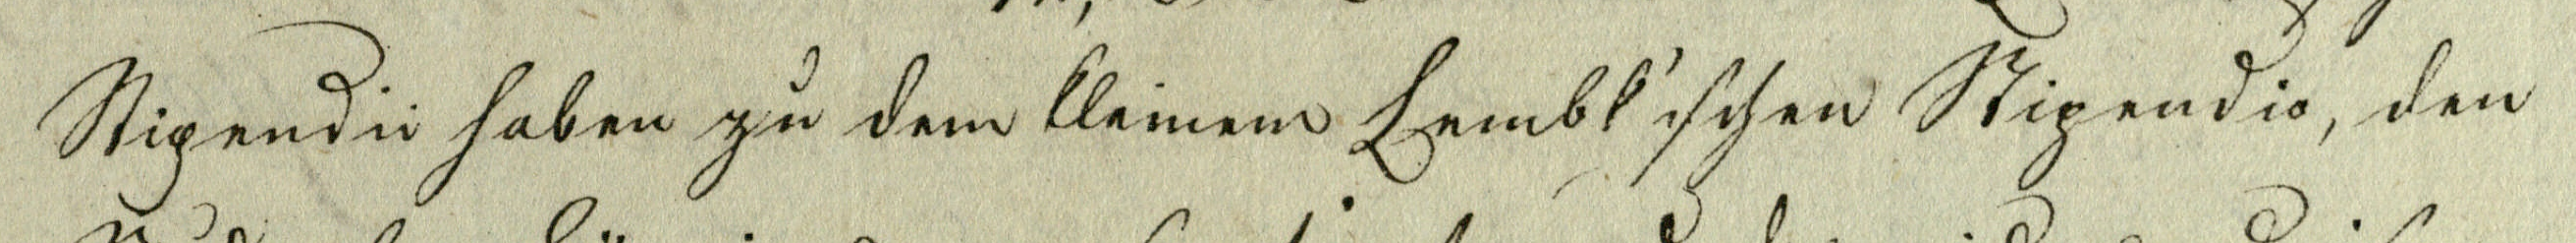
Stipendii haben zu dem kleinen Lemb'schen Stipendio, den
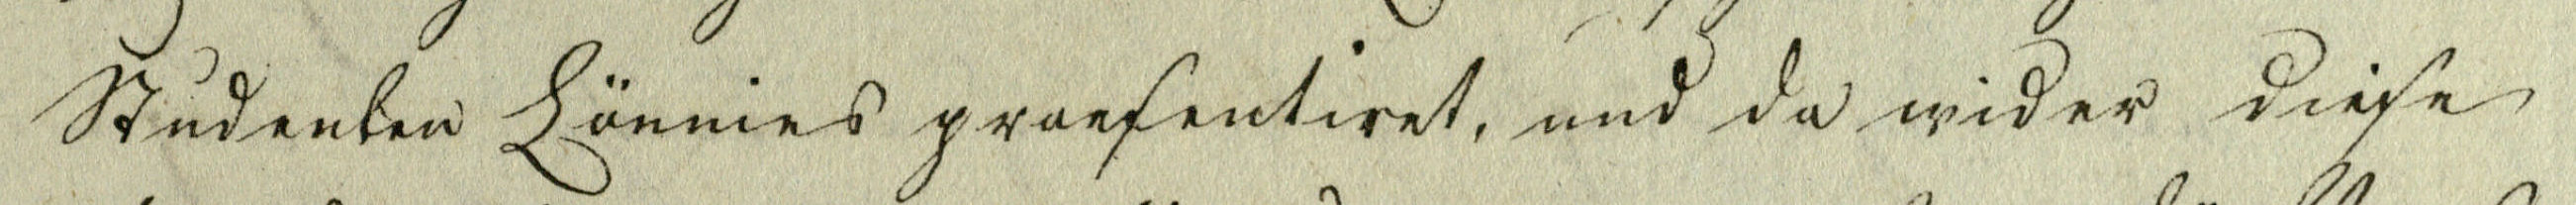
Studenten Lönnies praesentiret, und da wider diese
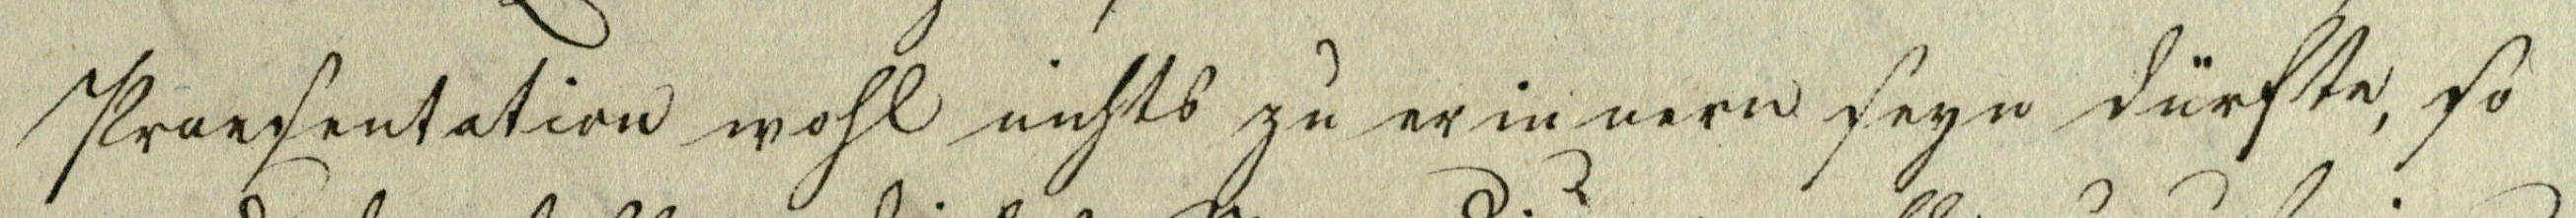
Praesentation wohl nichts zu erinnern seyn dürfte, so
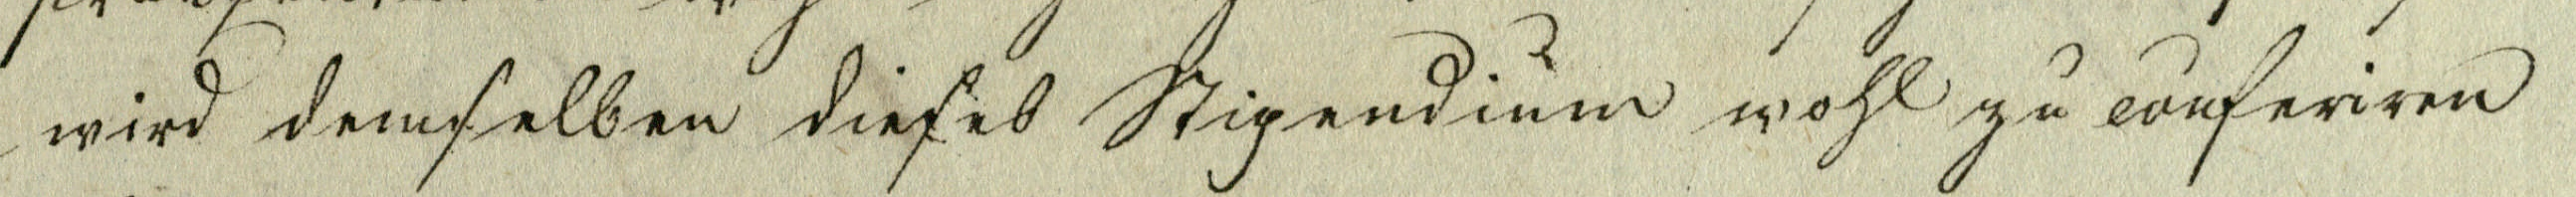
wird demselben dieses Stipendium wohl zu conferiren
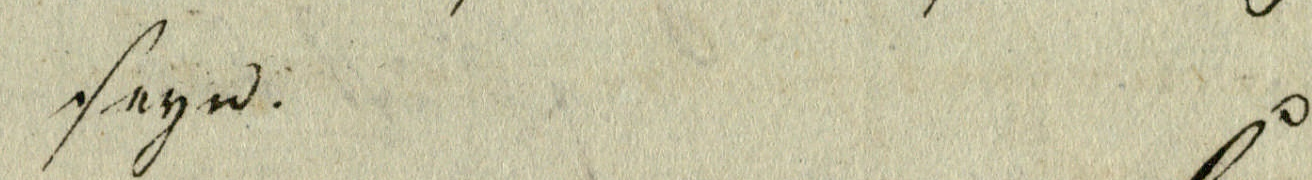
seyn.
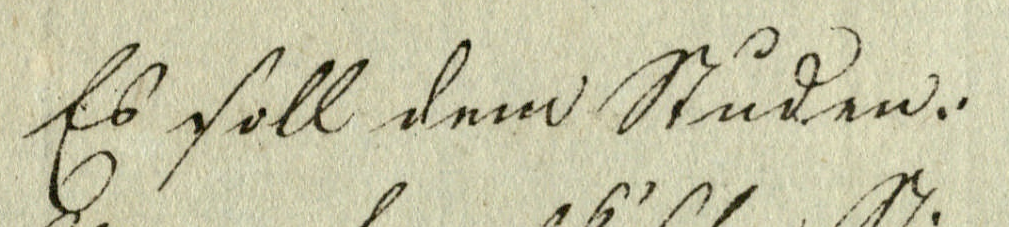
Es soll dem Studen¬
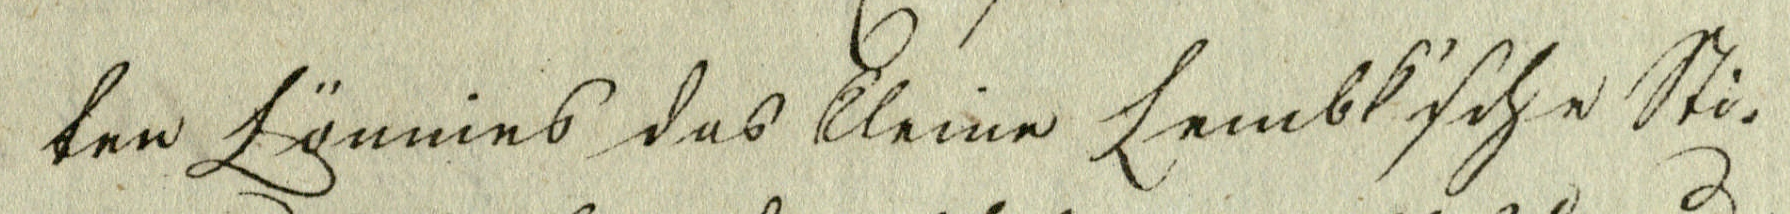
ten Lönnies das kleine Lembk'sche Sti¬
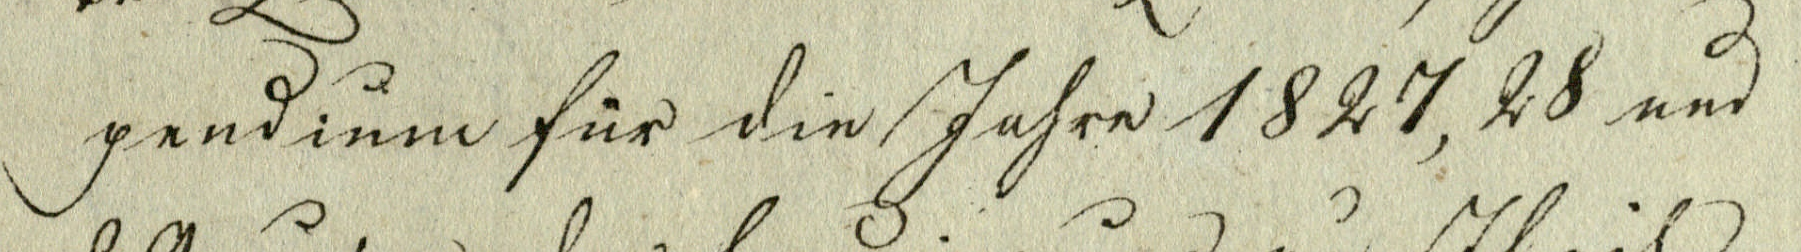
pendium für die Jahre 1827, 28 und
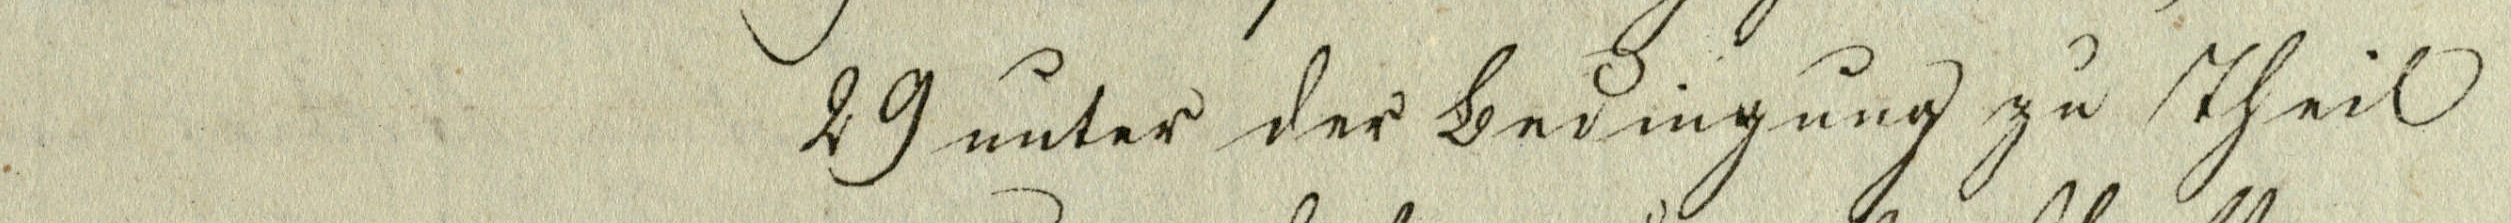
29 unter der Bedingung zu Theil
